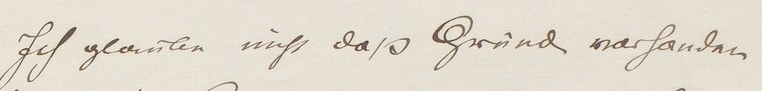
Ich glaube nicht daß Grund vorhanden
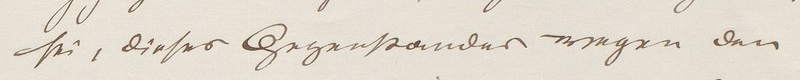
sei, dieses Gegenstandes wegen den
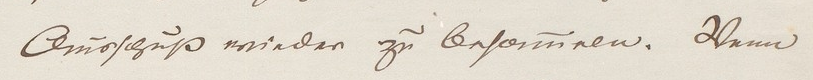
Ausschuß wieder zu besammeln. Wenn
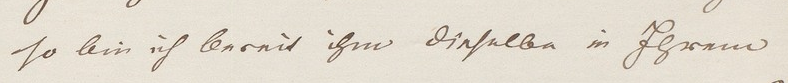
so bin ich bereit ihm dieselbe in Ihrem
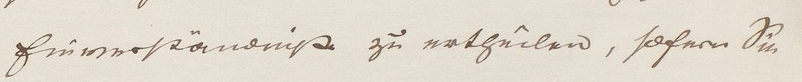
Einverständniß zu ertheilen, sofern Sie
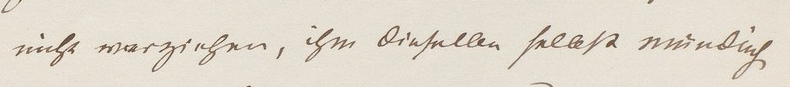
nicht vorziehen, ihm dieselbe selbst mündlich
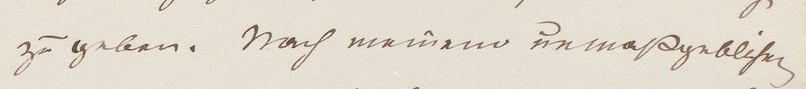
zu geben. Nach meinem unmaßgeblichen
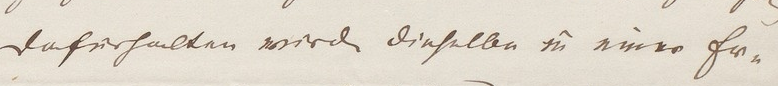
Dafürhalten wird dieselbe in einer Er-
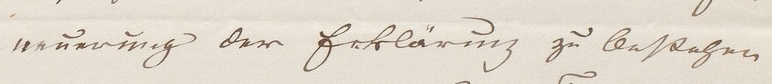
neuerung der Erklärung zu bestehen
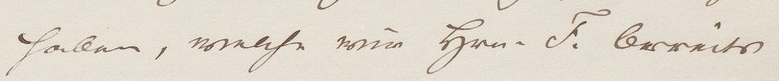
haben, welche wir Hrn. F. bereits
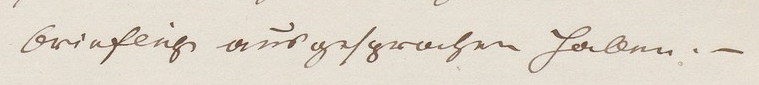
brieflich ausgesprochen haben. –
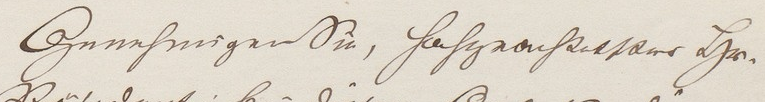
Genehmigen Sie, hochgeachtetster Hr.
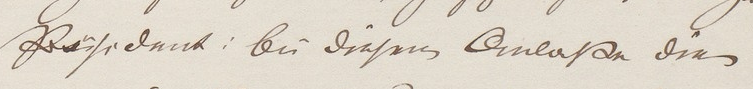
Präsident: bei diesem Anlaße die
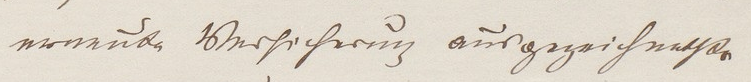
erneute Versicherung ausgezeichnetster
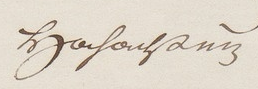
Hochachtung
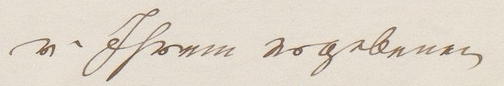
v. Ihrem ergebenen
